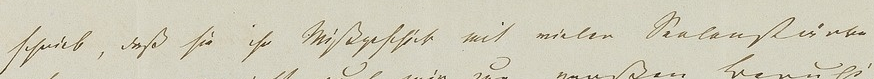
schrieb, daß sie ihr Mißgeschick mit vieler Seelenstärke
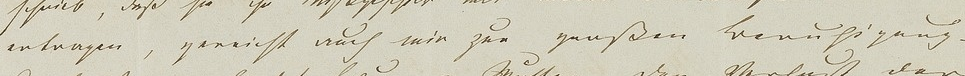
ertragen, gereicht auch mir zur großen Beruhigung.
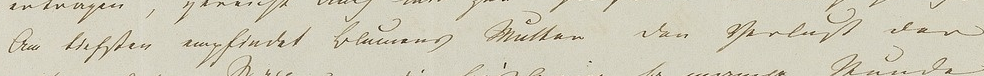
Am tiefsten empfindet Blumers Mutter den Verlust der
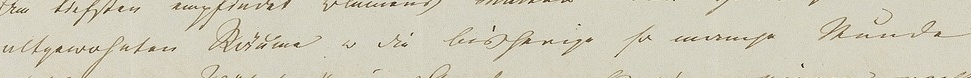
altgewohnten Räume & die bisherige so manche Stunde
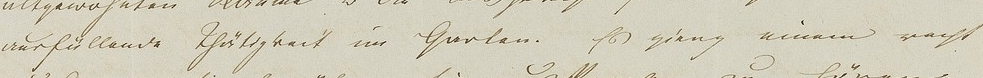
ausfüllende Thätigkeit im Garten. Es gieng einem recht
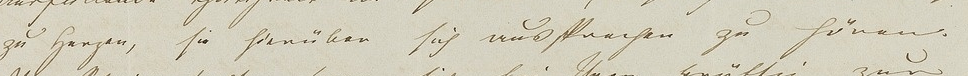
zu Herzen, sie hierüber sich aussprechen zu hören.
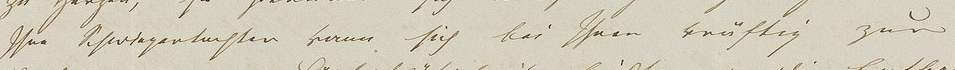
Ihre Schwiegertochter kann sich bei Ihrer kräftig zur
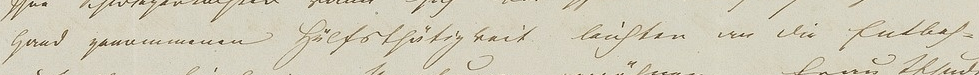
Hand genommenen Hülfsthätigkeit leichter an die Entbeh-
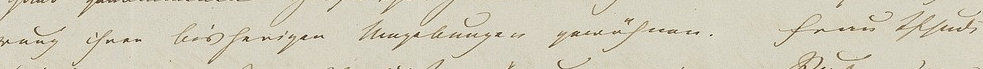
rung ihrer bisherigen Umgebungen gewöhnen. Frau Tschudi
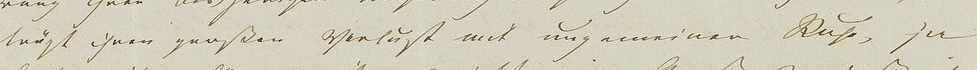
trägt ihren großen Verlust mit ungemeiner Ruhe, ja
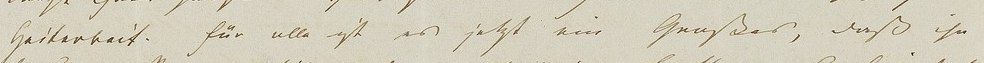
Heiterkeit. Für alle ist es jetzt ein Großes, daß ihr
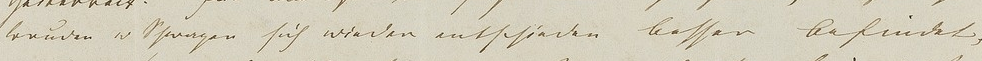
Bruder & Schwager sich wieder entschieden besser befindet,
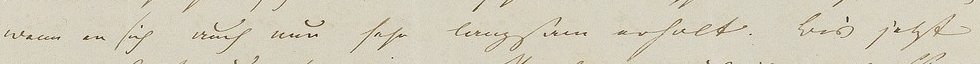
wenn er sich auch nur sehr langsam erholt. Bis jetzt
